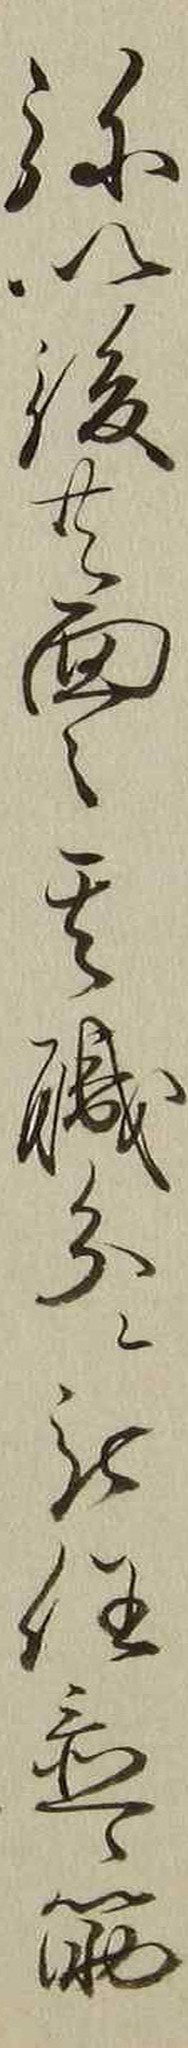弥以後共面々其職分に被任置候筋
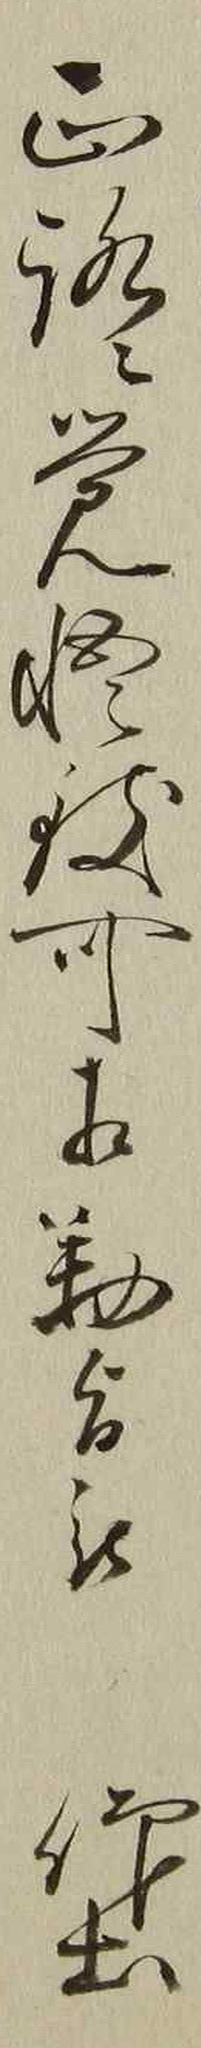正路に覚悟致可相勤旨被仰出
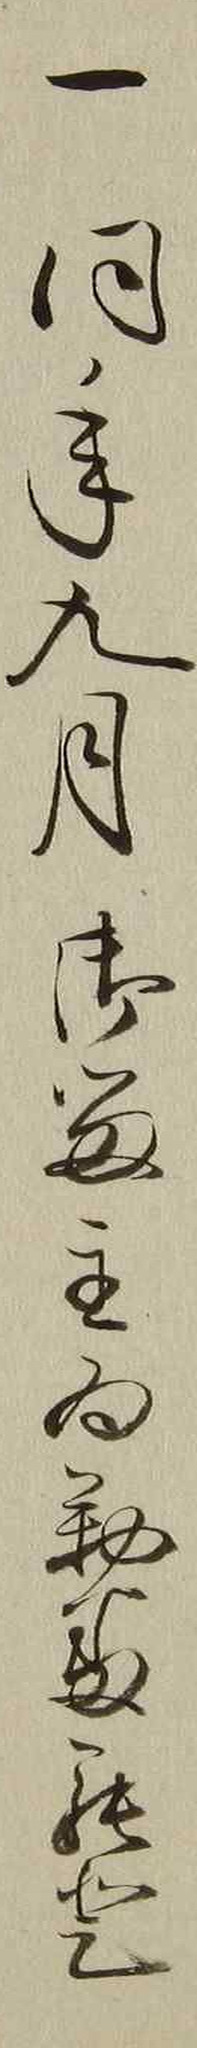一同年九月御留主為勤番罷登
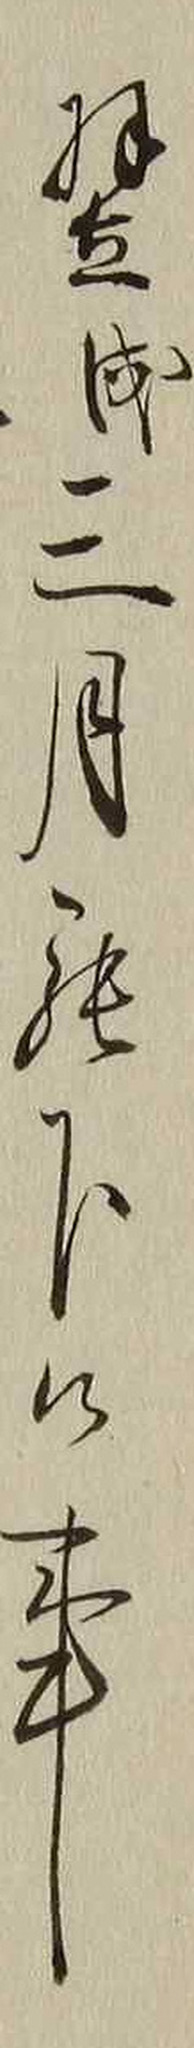翌戌三月罷下候事
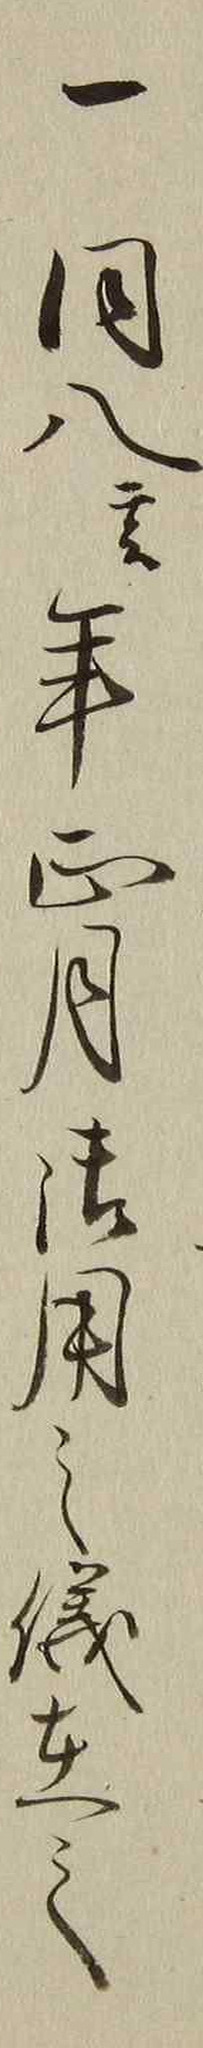一同八亥年正月御用之儀在之
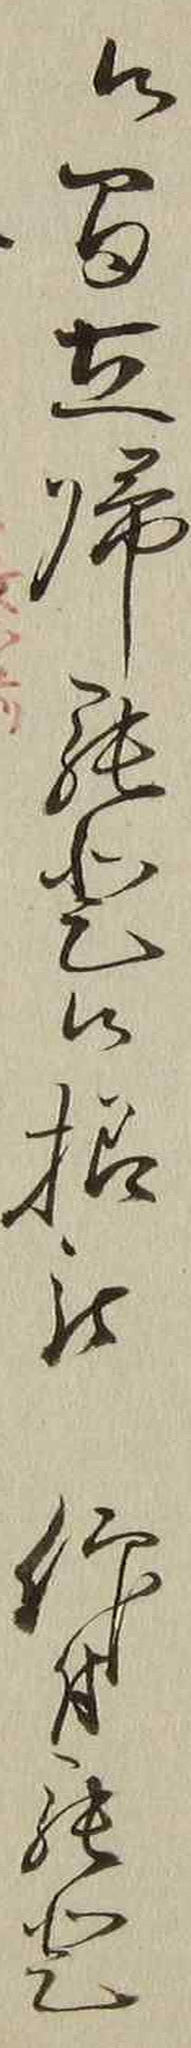候間立帰罷登候様被仰付罷登
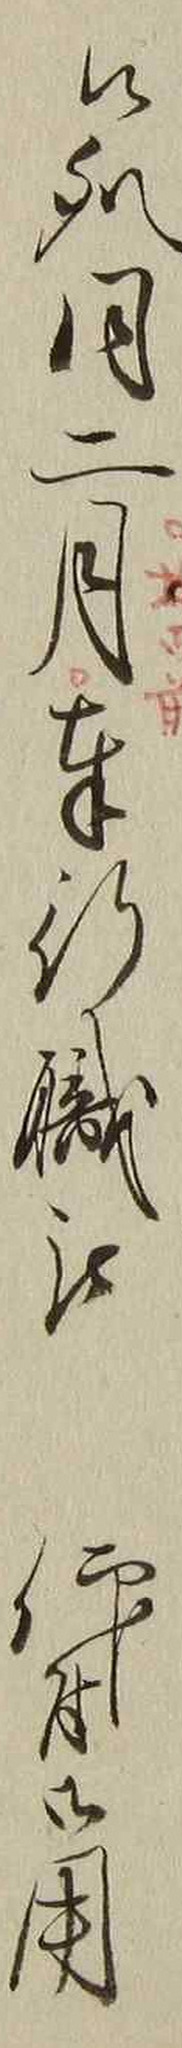候処同二月奉行職被仰付御用
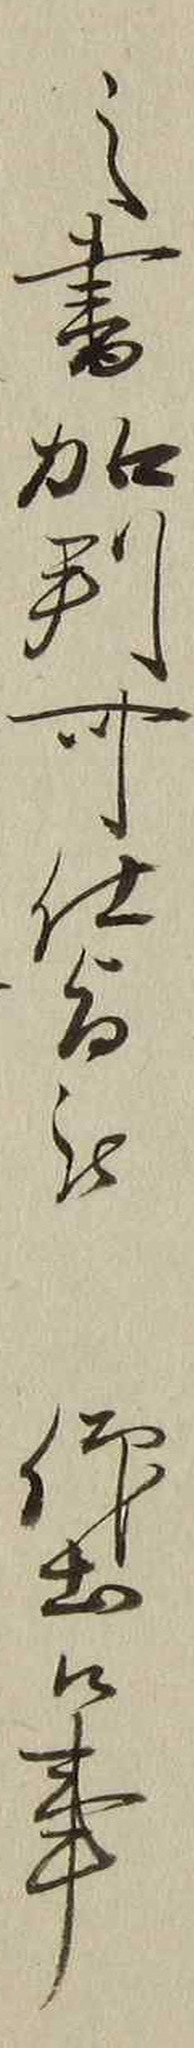之書加判可仕旨被仰出候事
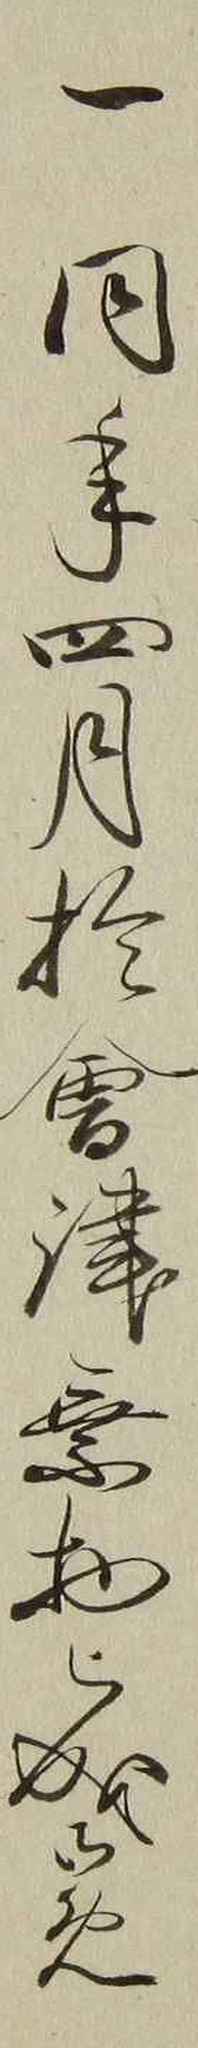一同年四月於会津乗物被成御免
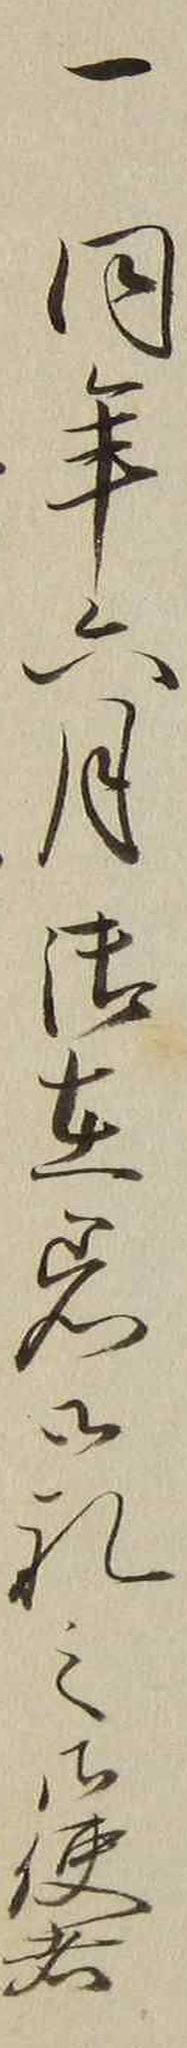一同年六月御在着御礼之御使者
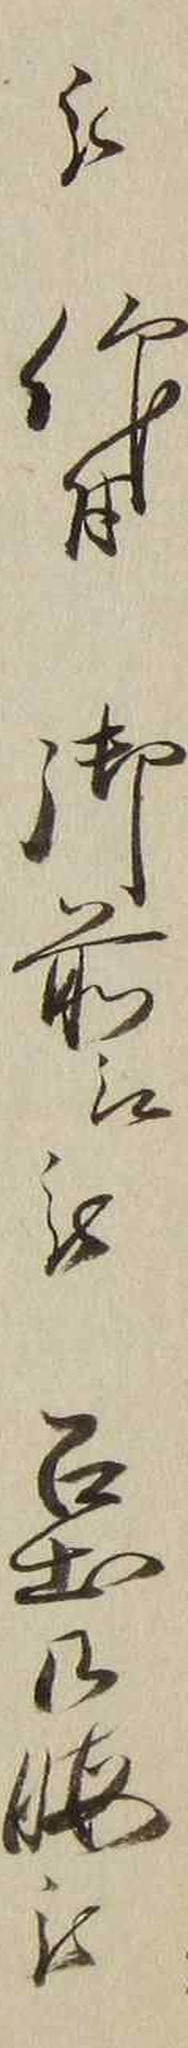被仰付御前江被召出御暇被
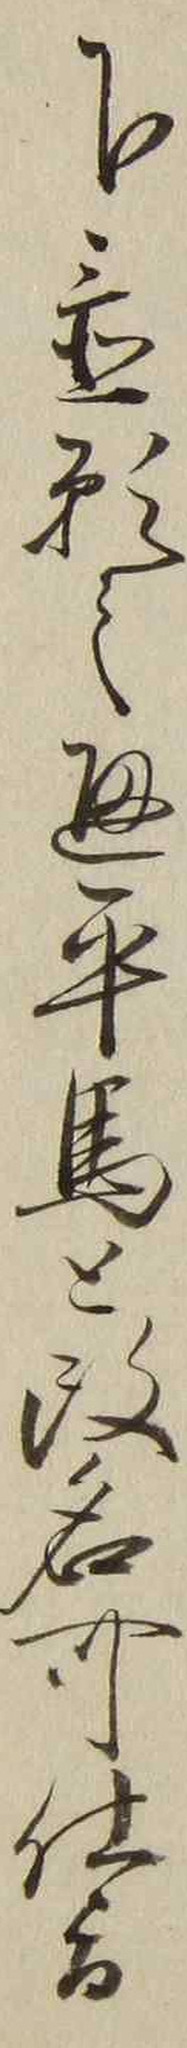下置願之通平馬と改名可仕旨

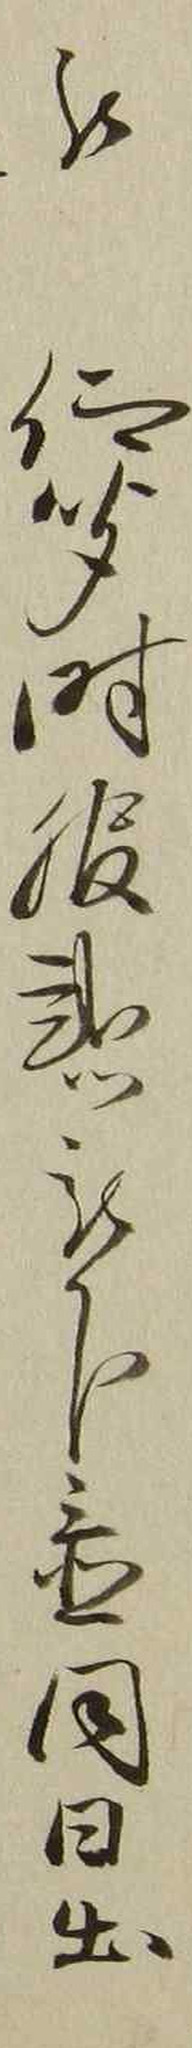被仰聞時服弐つ被下置同日出
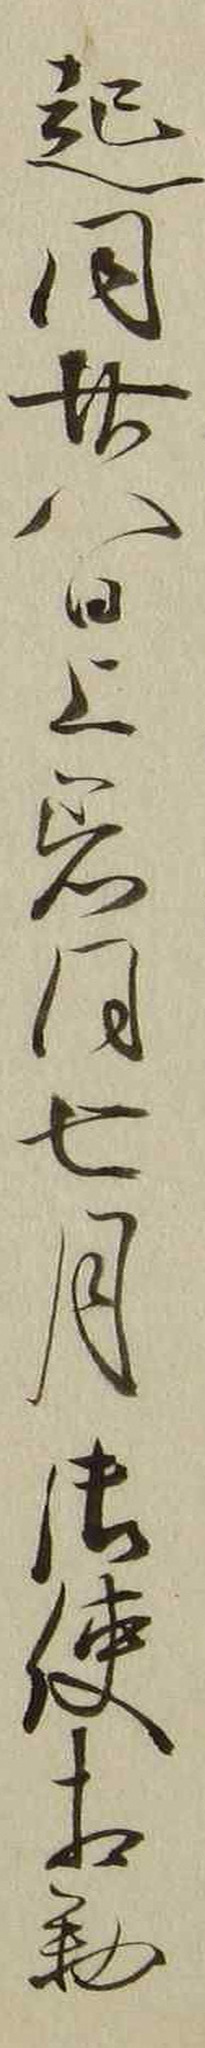起同廿八日上着同七月御使相勤
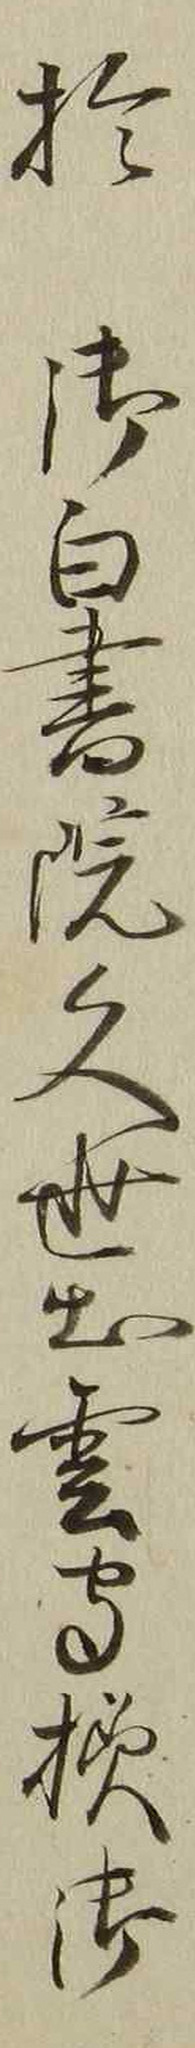於御白書院久世出雲守様御
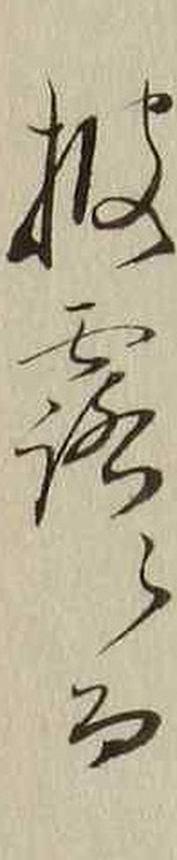披露に而
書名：諸士系譜　巻之103　か之部11
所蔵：会津若松市立会津図書館
